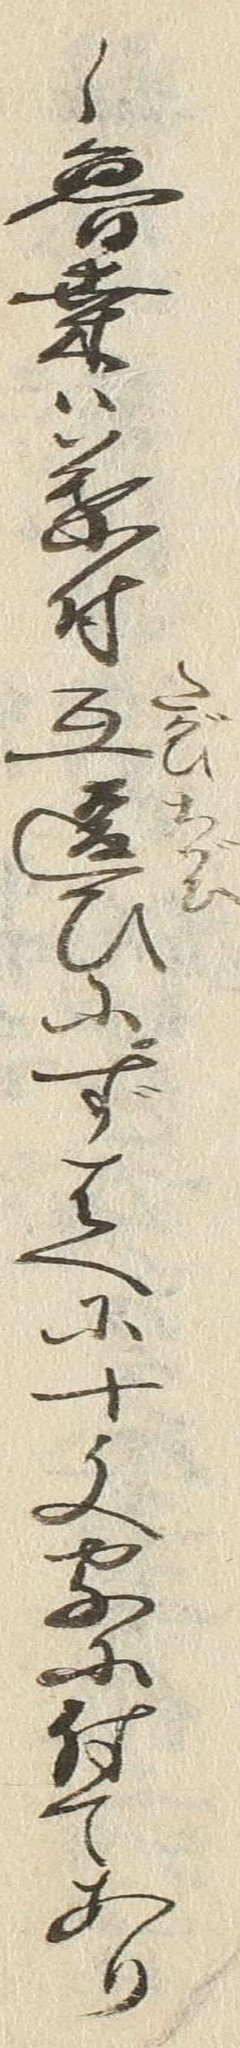し魯桑は葉付互違ひ尓ずはへ尓十文字尓付てあり
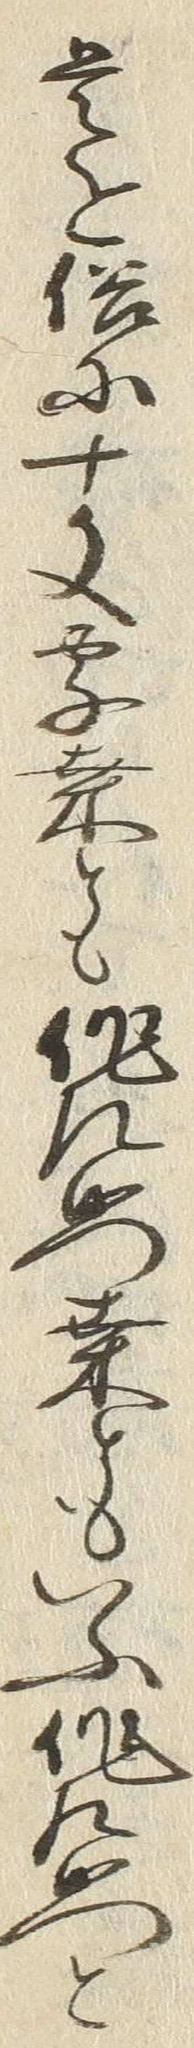是を俗尓十文字桑とも作左衛門桑ともいふ作左衛門と
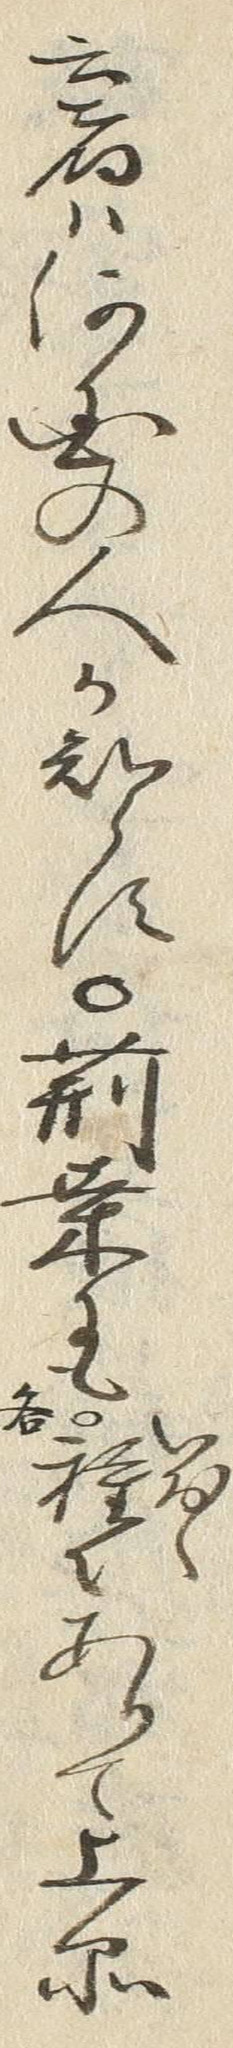云者は何國の人か知らず〇荊桑尓も各種々ありて上品
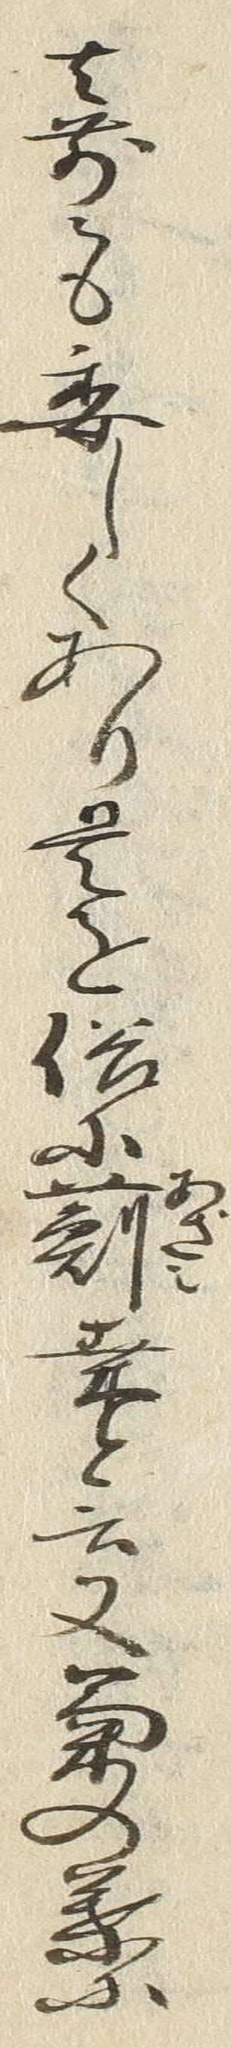者前にも委しくあり是を俗尓薊桑と云又菊の葉尓
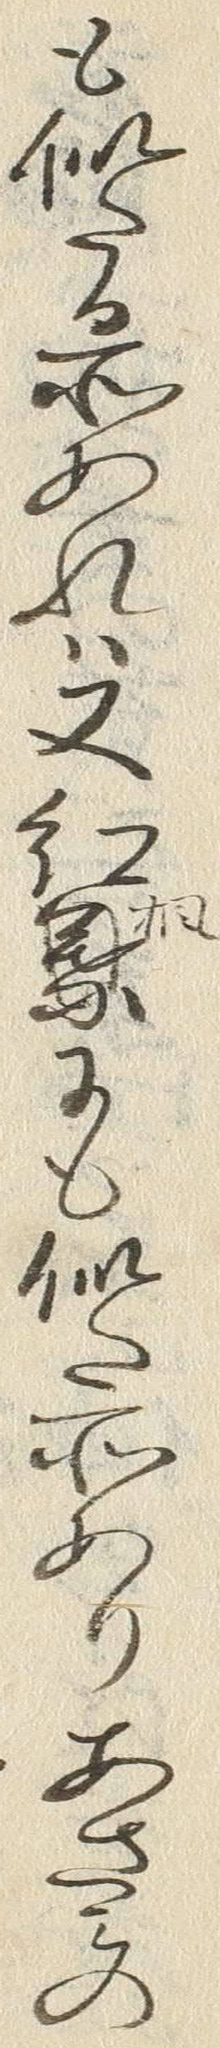も似たる所あれは又紅楓尓も似た所ありあさみの
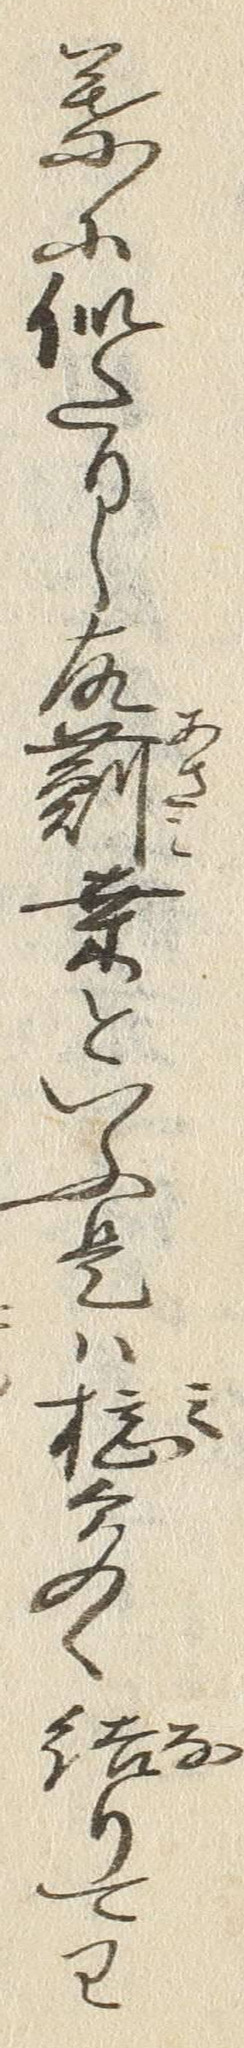葉尓似たりし故薊桑といふ是は椹多く結りてわ
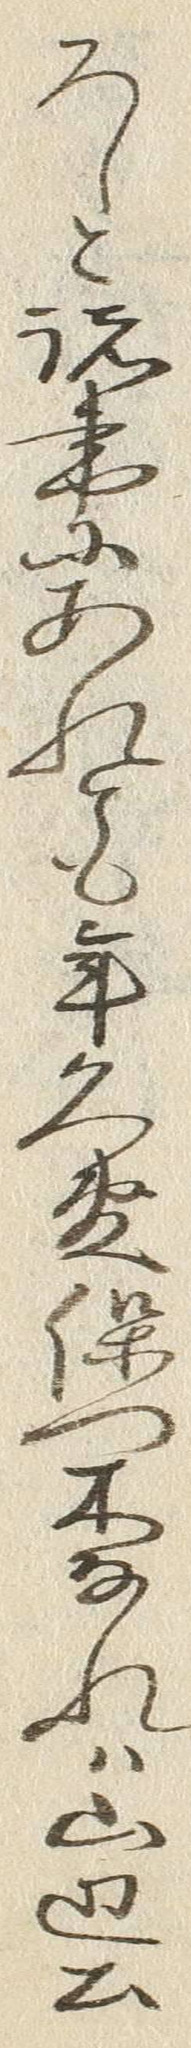ろしと諸事尓あれとも年久敷保つ木なれは山辺土
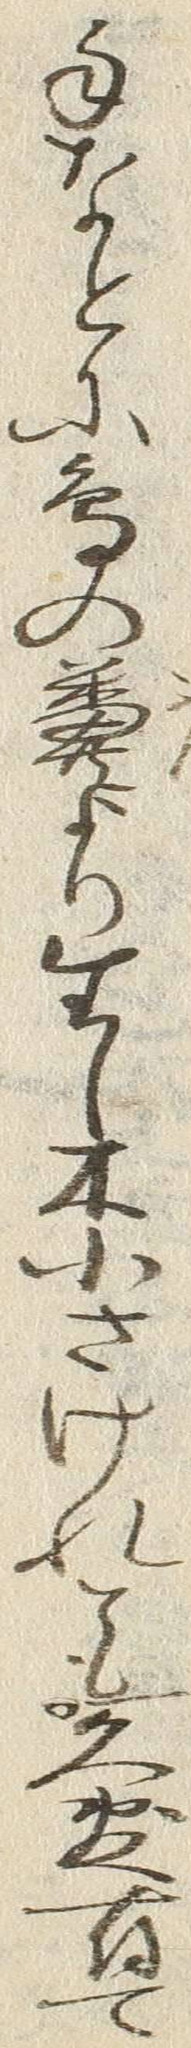手なと尓鳥の糞より生し木小さけれとも年久敷有て
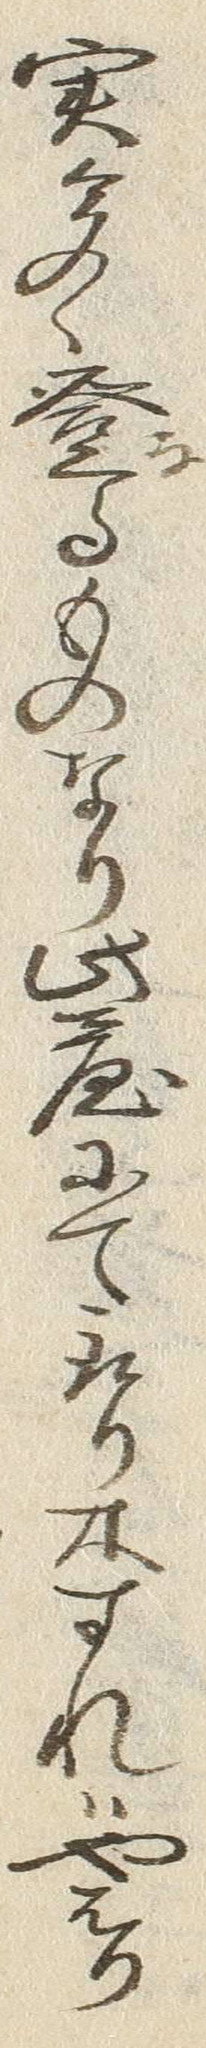実多く登るものなり此臺尓て取り木すれはやはり
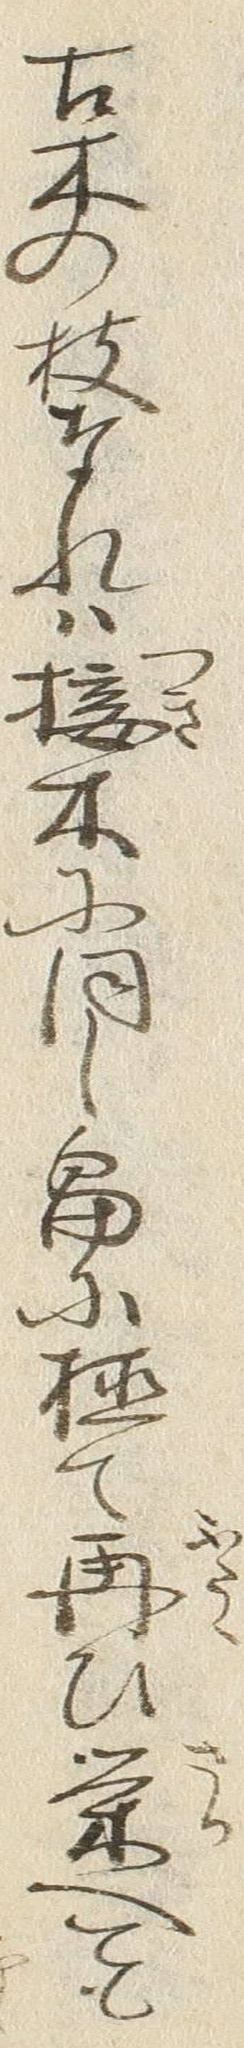古木の枝なれは接木尓同し畠尓植て再ひ栄へとも
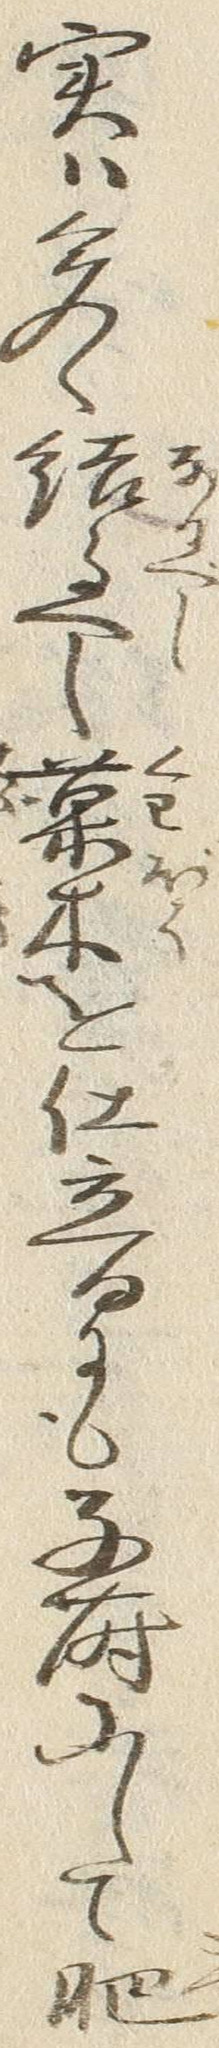実は多く結るべし菓木を仕立る尓も子蒔尓して肥
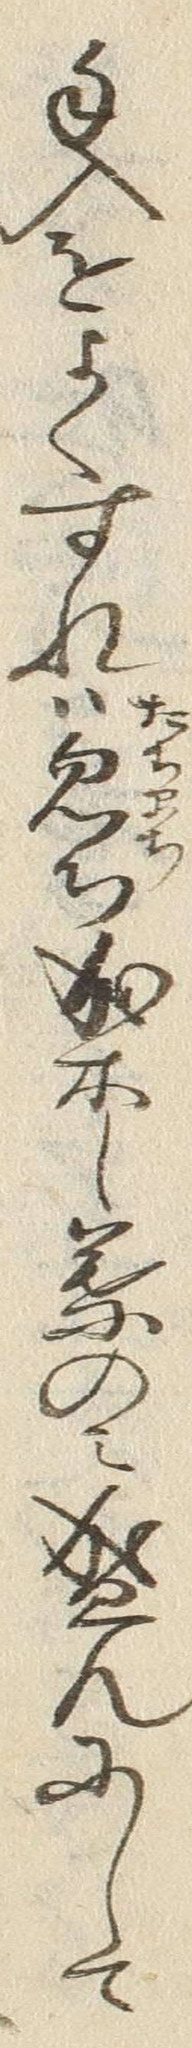手入をよくすれは忽ち成等し葉のみ盛ん尓して
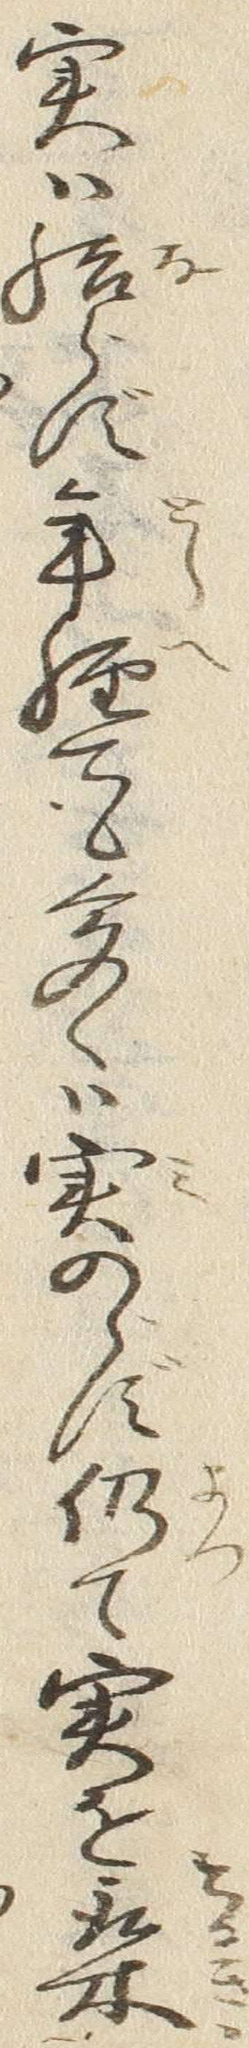実は結らず年経ても多くは実のらず仍て実を取木
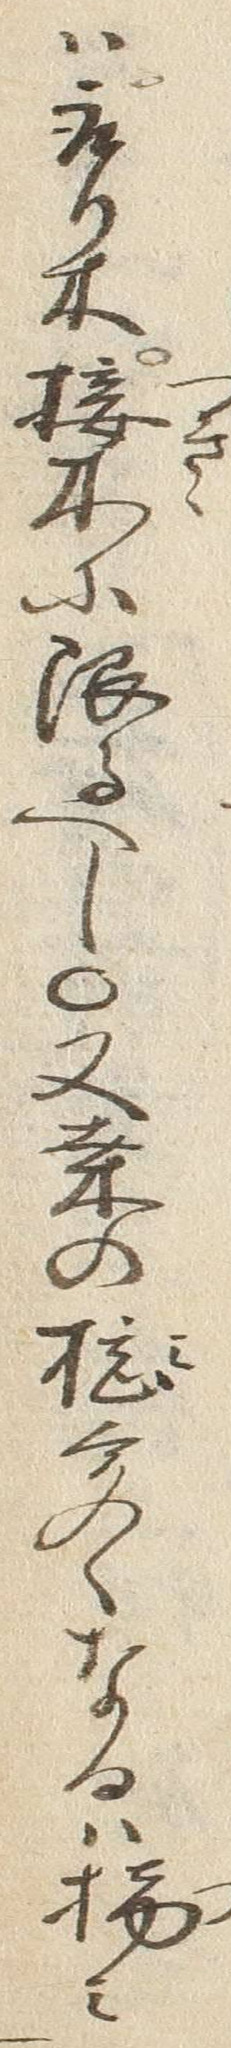は取り木。接木尓限るへし〇又桑の椹多くなるは摘み

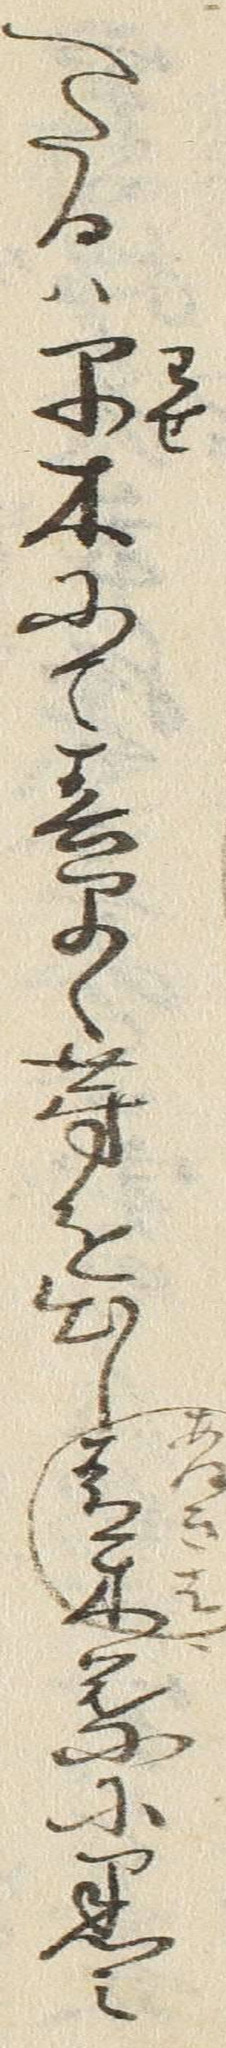へたるは早木尓て春早く芽を出し青木葉尓黒み
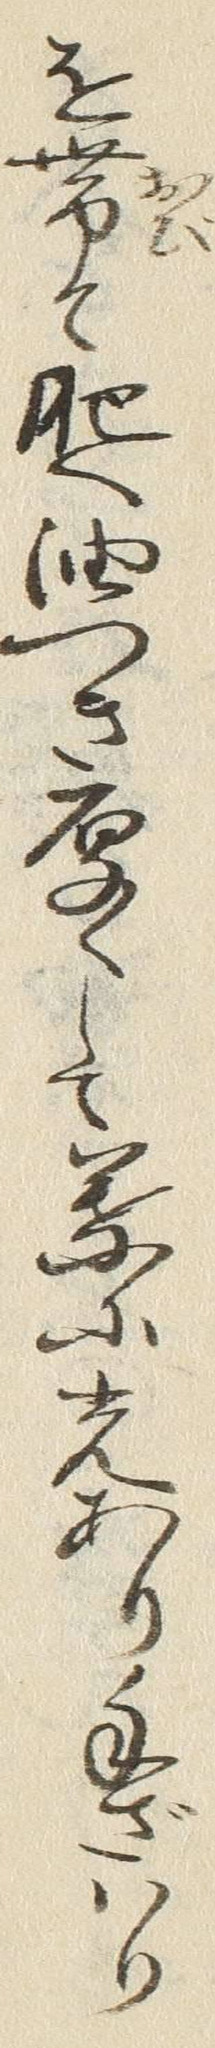を帯て肥へ油つき厚くして葉尓光あり手ざはり
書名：養蠶實驗録後編
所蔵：東京大学農学生命科学図書館 国文学研究資料館
